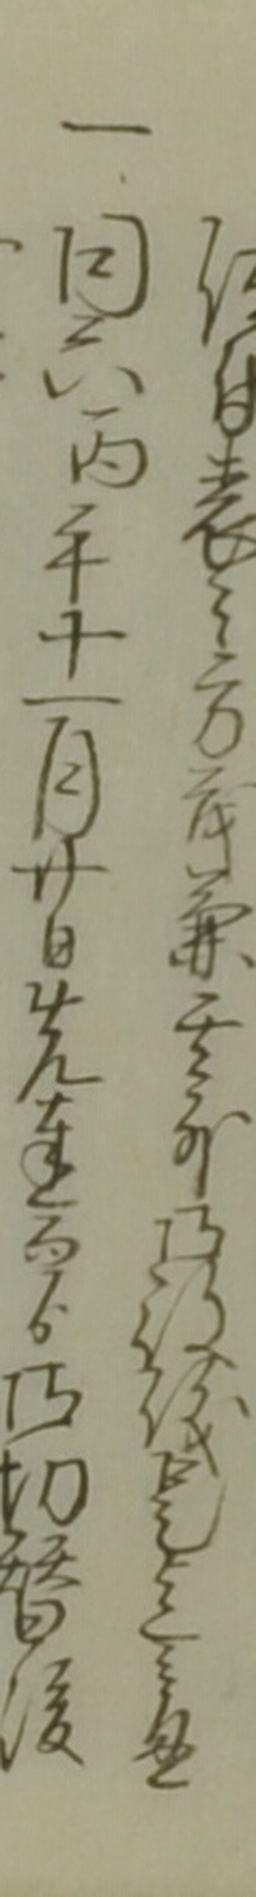一同六丙午十一月廿日先達而ゟ御切替後
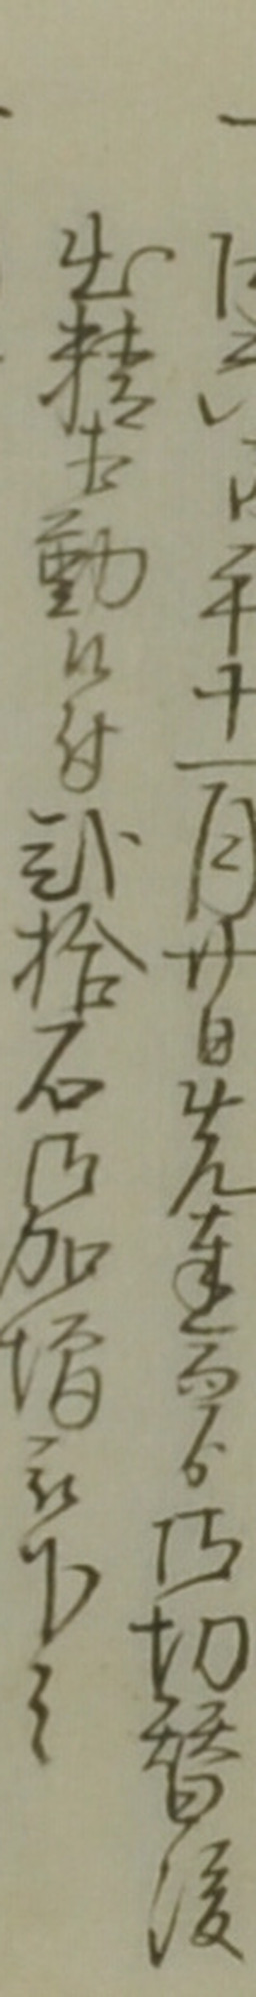出精相勤候付弐拾石御加増被下之
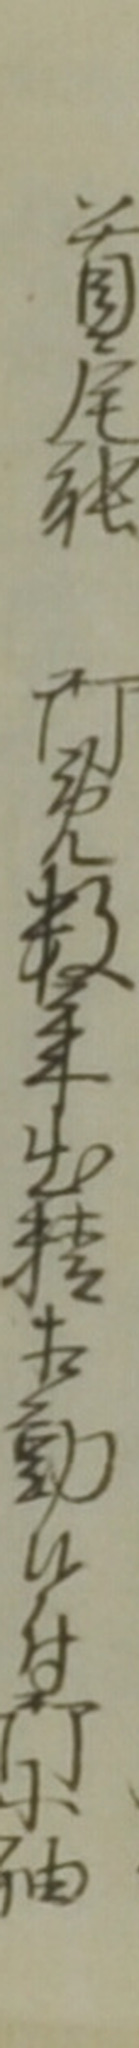首尾能御免数年出精相勤候付御小袖
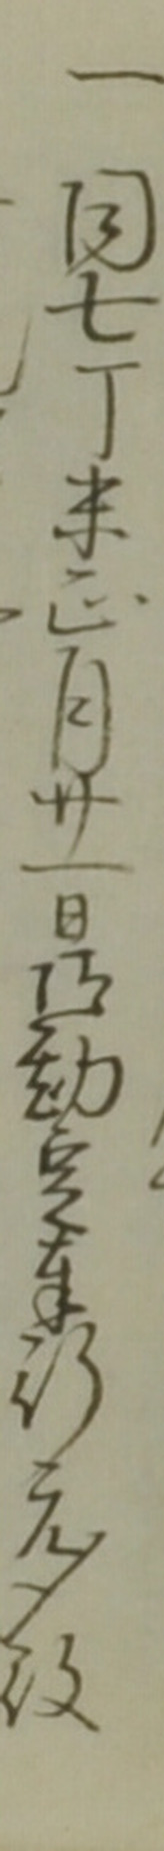一同七丁未正月廿一日御勘定奉行元〆役
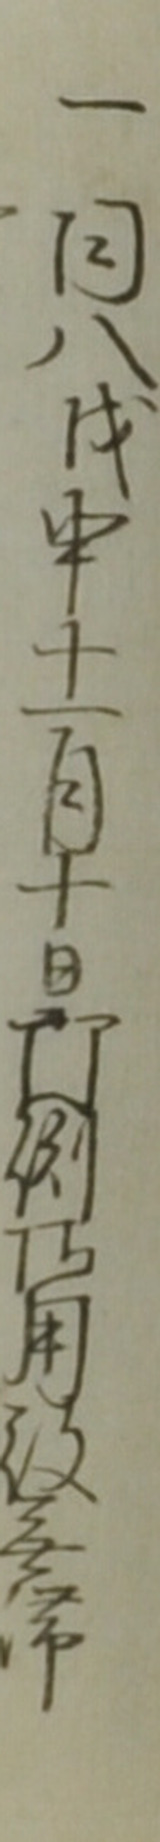一同八戊申十一月十日御側御用役無滞
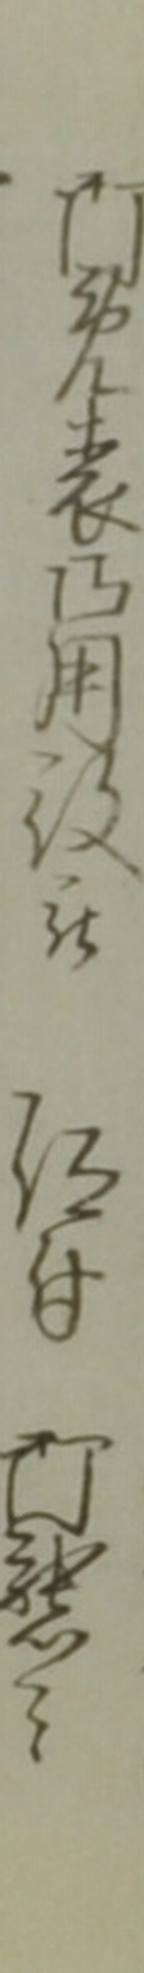御免表御用役被仰付御懇之
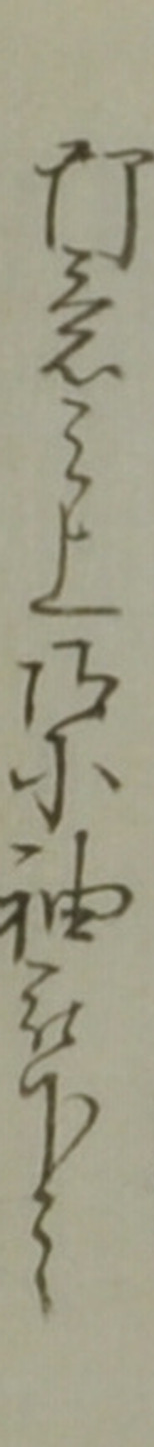御意之上御小袖被下之
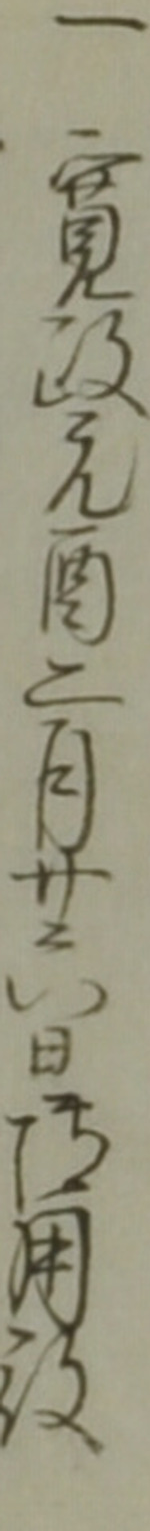一寛政元酉二月廿六日御用役
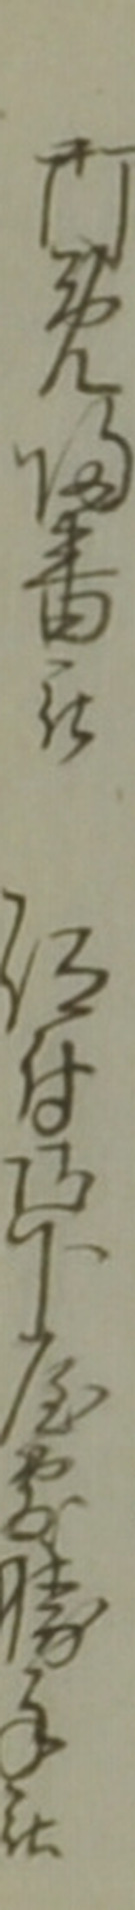御免帰番被仰付御下屋敷勝手被
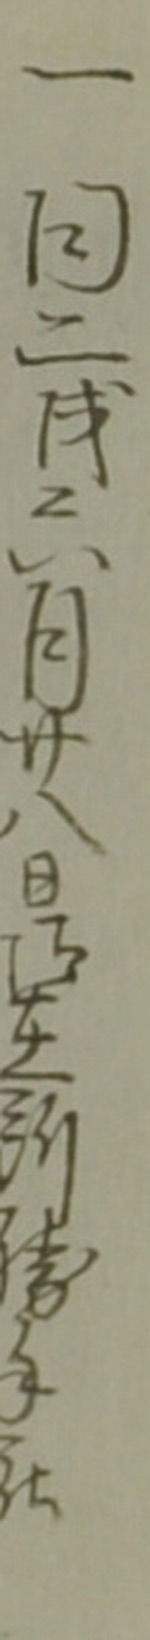一同二戌六月廿八日御在所勝手被
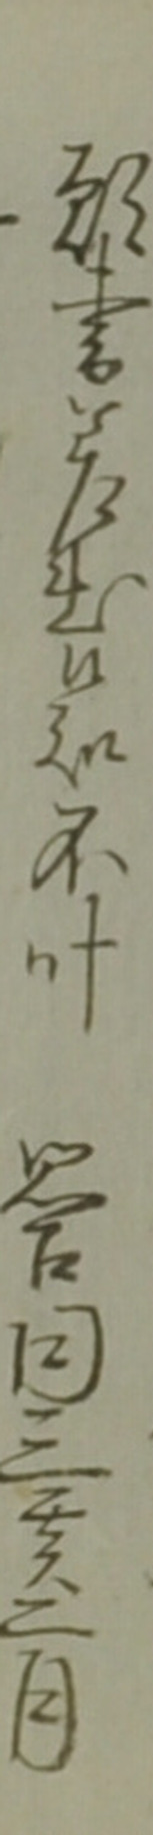願書差出候処不叶思召同三亥二月
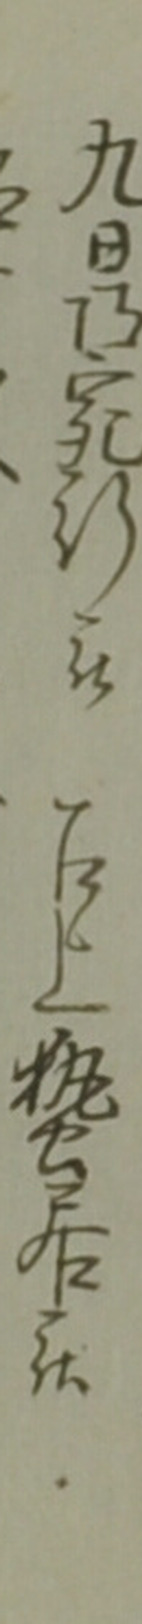九日御宛行被召上蟄居被
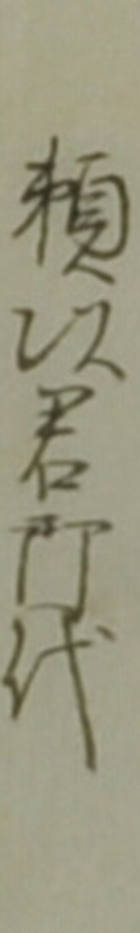頼以君御代

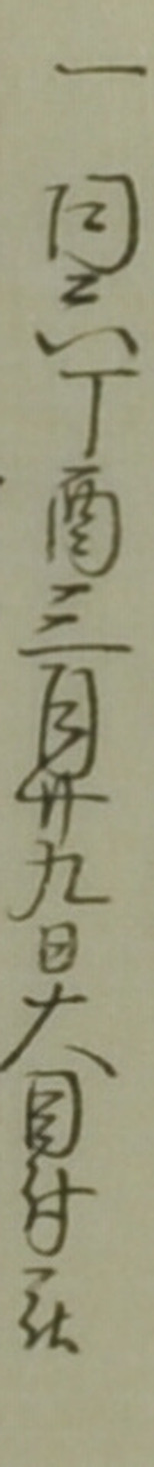一同六丁酉三月廿九日大目付被
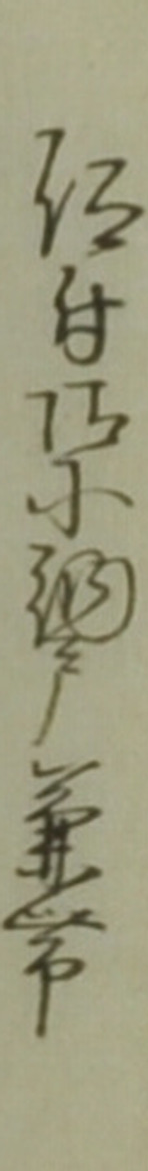仰付御小納戸兼帯
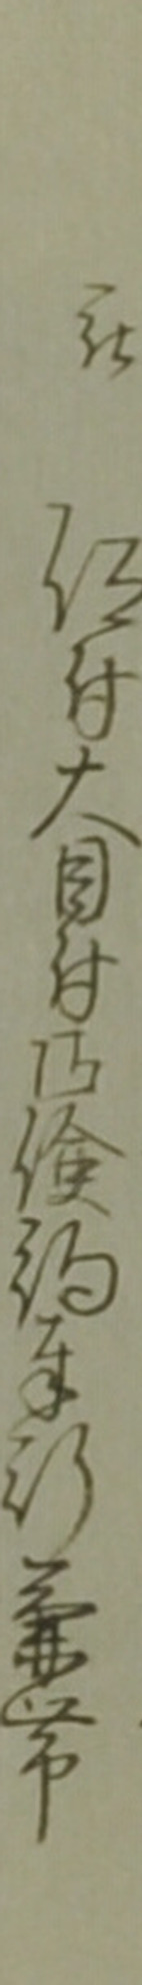被仰付大目付御倹約奉行兼帯
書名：給人諸士勤仕録（三）
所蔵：伊那市立高遠町図書館・合同会社AMANE
